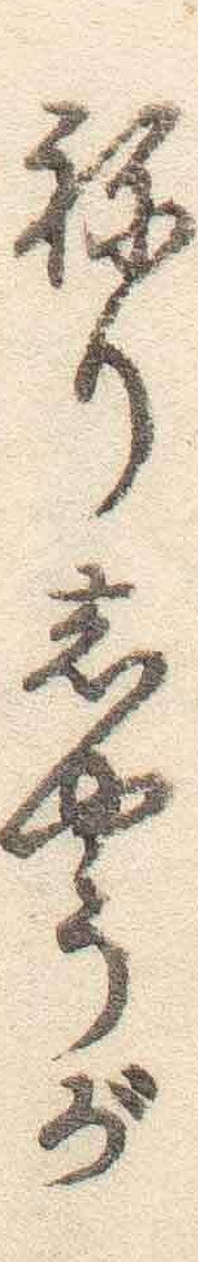ねりしやうが
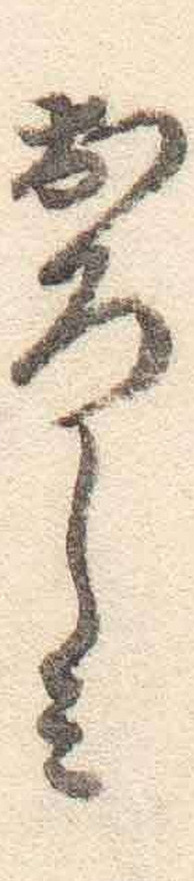おろしみ
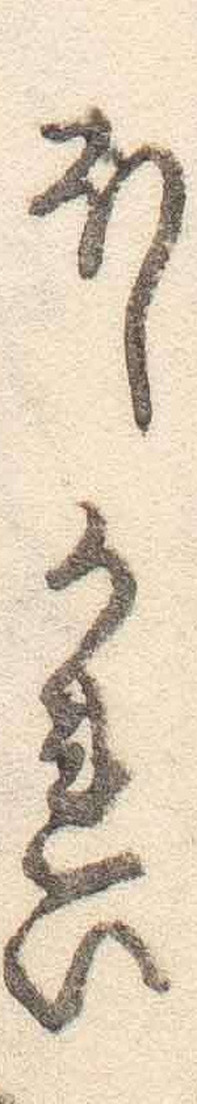ほしかれい
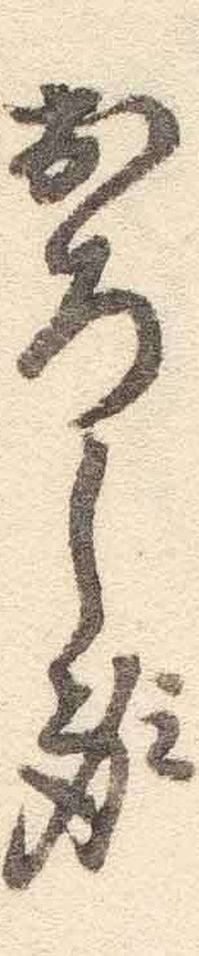おろしみ
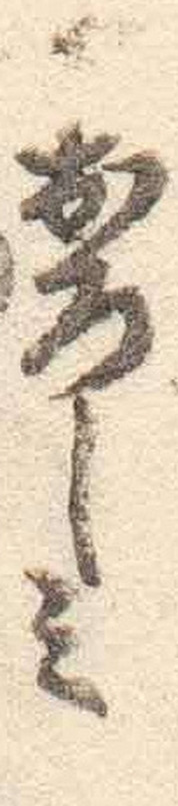おろしみ
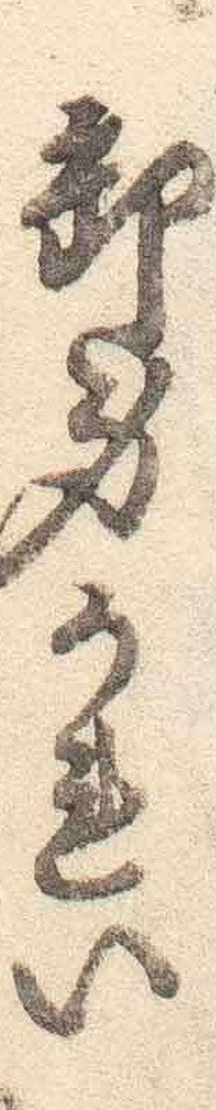卸身かれい
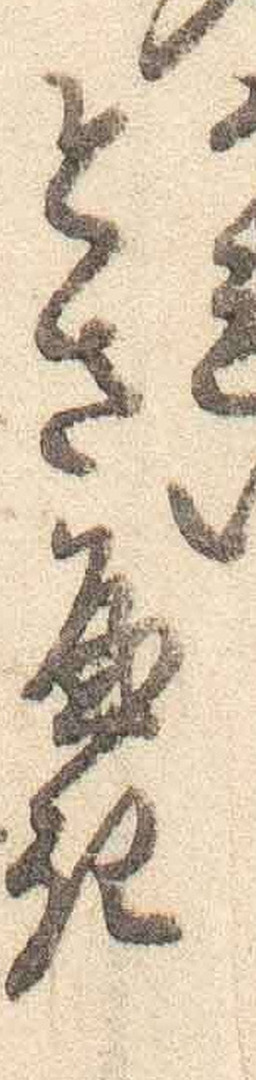とさやき
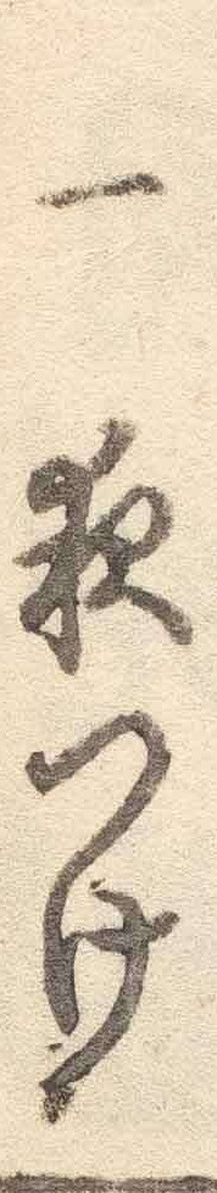一夜つけ
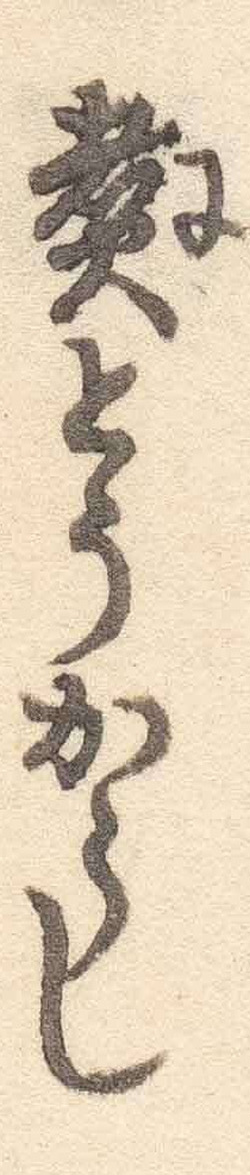煮とうからし
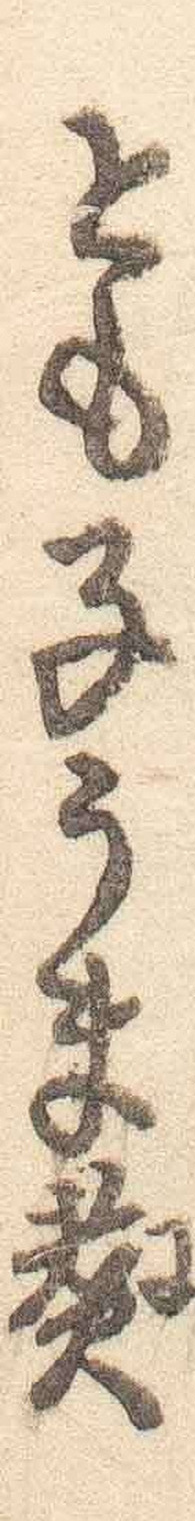とも子うま煮
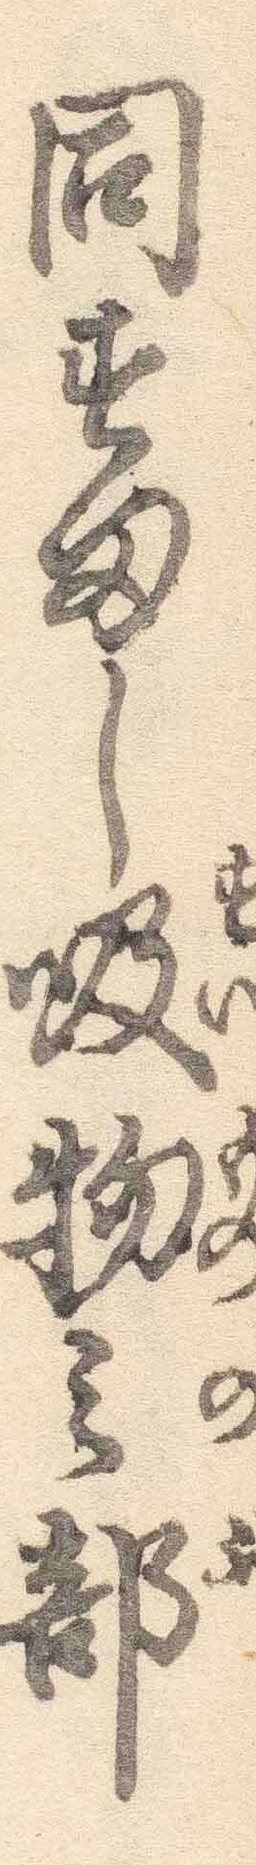同すまし吸物之部
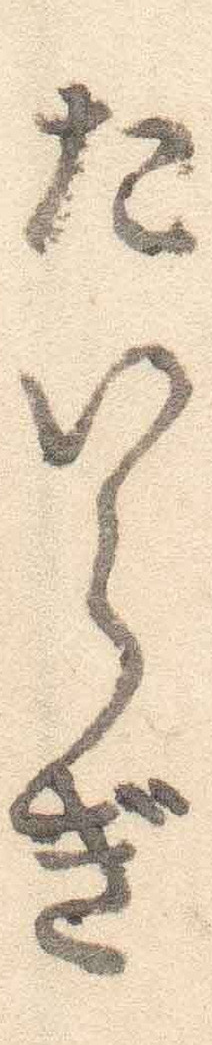たいらぎ
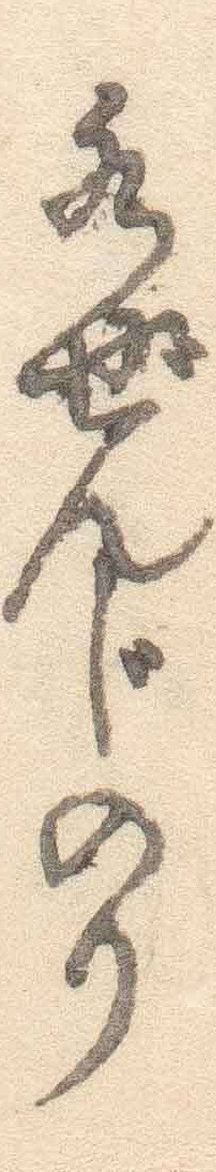水ぜんじのり
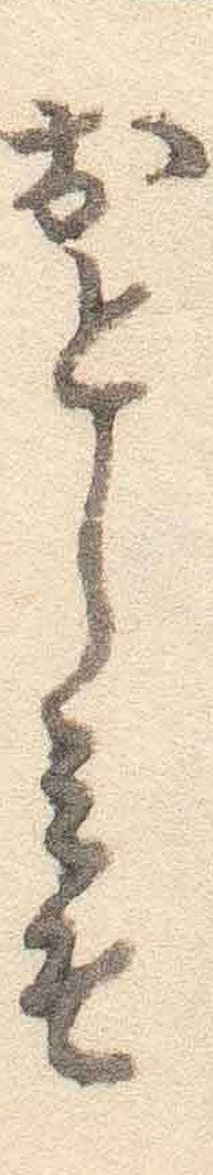おとしみそ
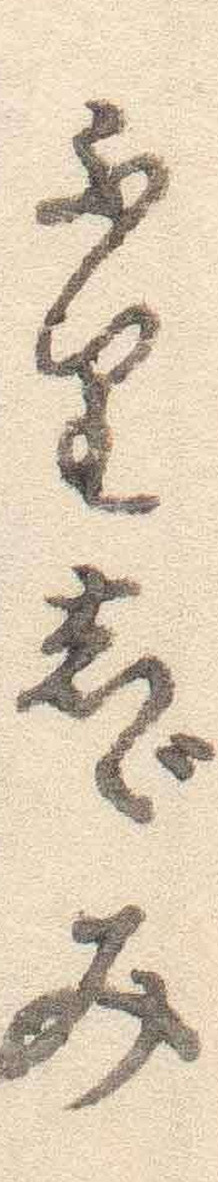ふりしゞみ
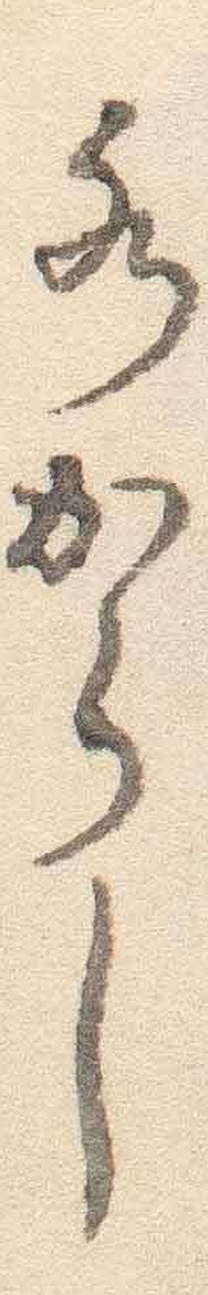水からし
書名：料理通
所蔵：東京学芸大学附属図書館 国文学研究資料館
